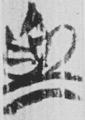爲
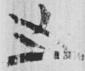之
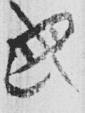母
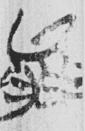能
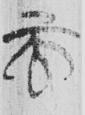而
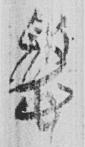惖（易）
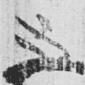之
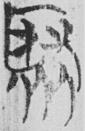聚（驟）
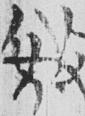敓（奪）
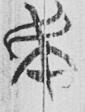民
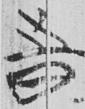○（時）
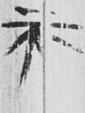天
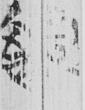○（饑）
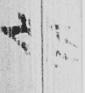必
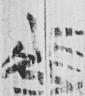○（來）
